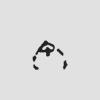內
